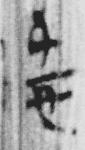○（仁）
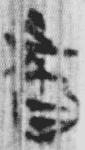者
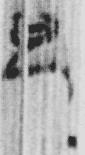也
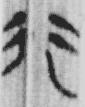行
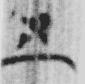之
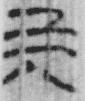而
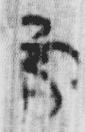不
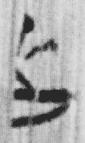○（過）
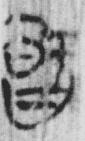智（知）
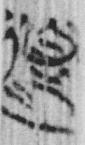道
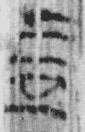者
